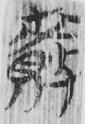{未攴貝}（釐）
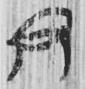君
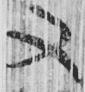又（有）
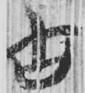古（故）
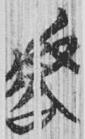○（乎）
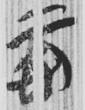○（願）
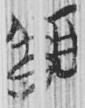○（聞）
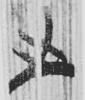之
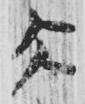大（太）
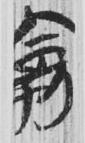○（宰）
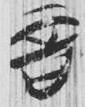言
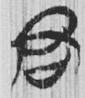君
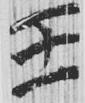王
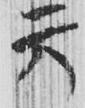元
